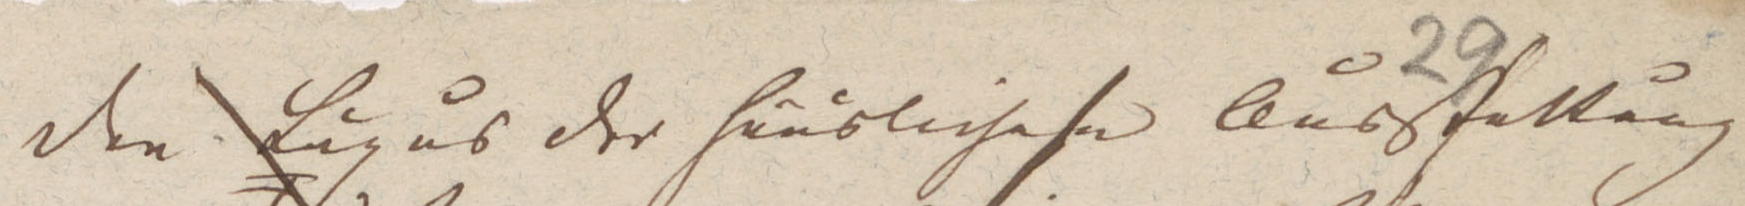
Den Luxus der häuslichen Ausstattung
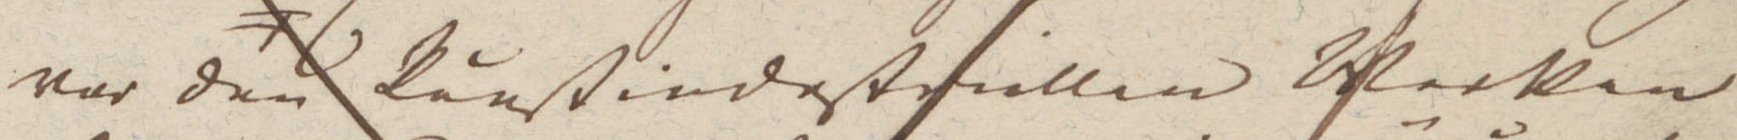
vor den % kunstindustriellen Werken
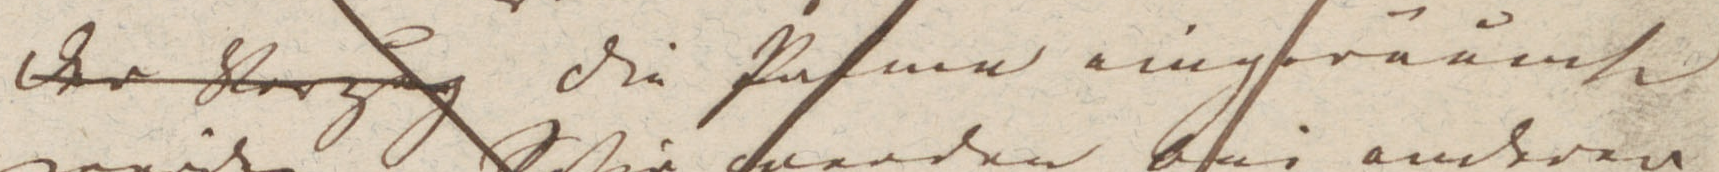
der Vorzug die Pannen eingeräumt
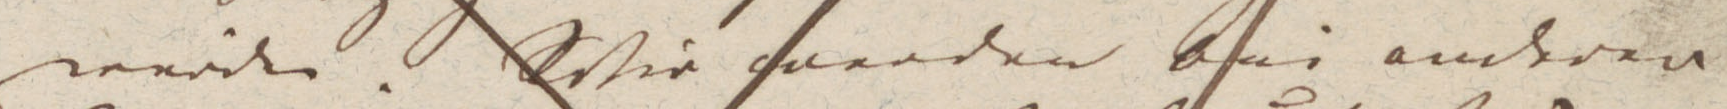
würde. Wir werden bei anderer
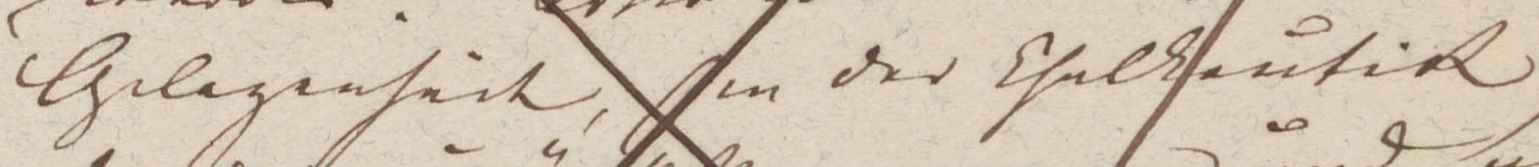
Gelegenheit, (in der Chalkeutik)
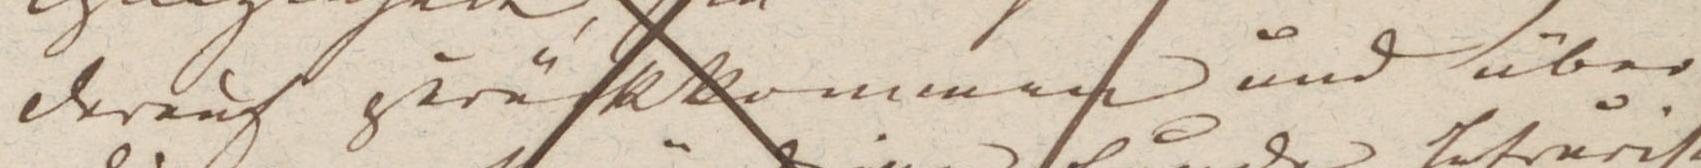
darauf zurückkommen und über
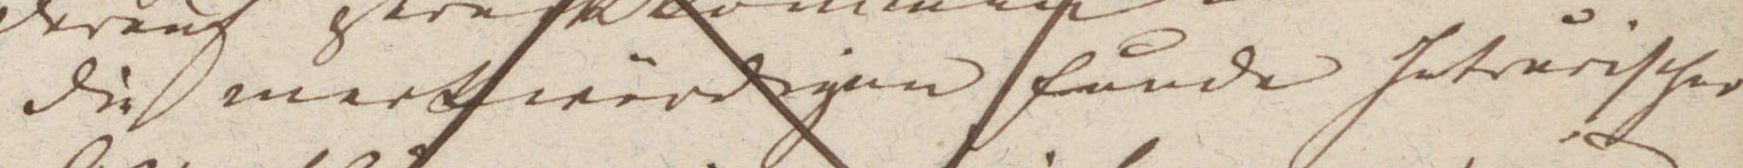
die merkwürdigen Funde hetrurischer
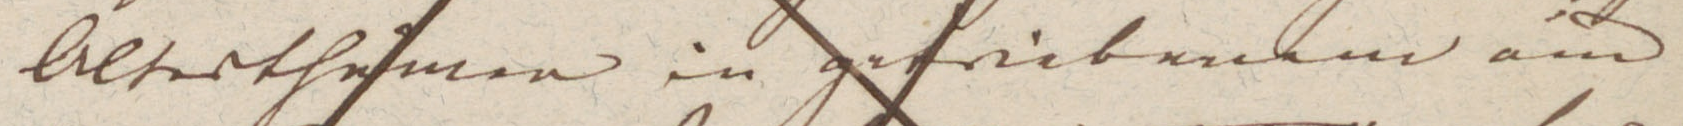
Alterthümer in getriebenem und
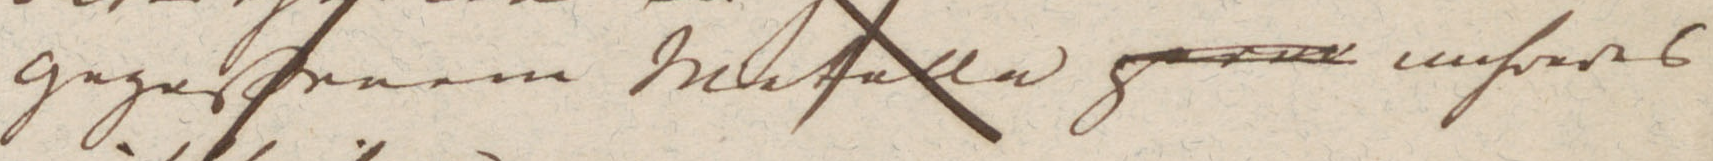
gegossenem Metalle gena mehreres
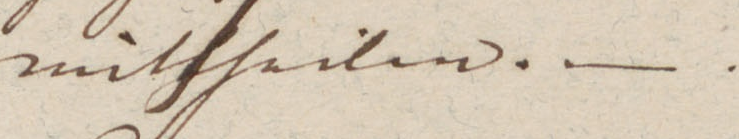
mittheilen. – .
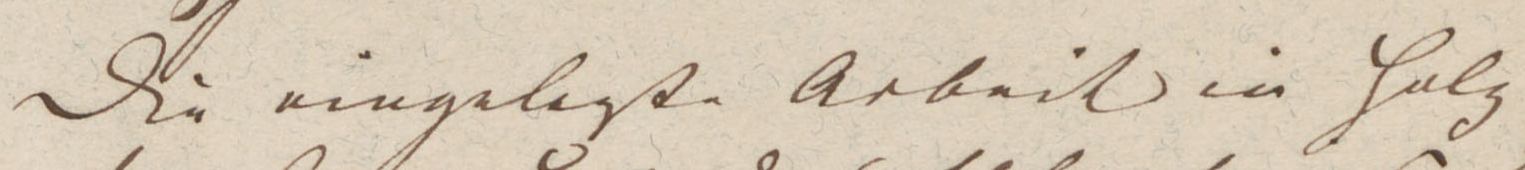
Die eingelegte Arbeit in Holz,
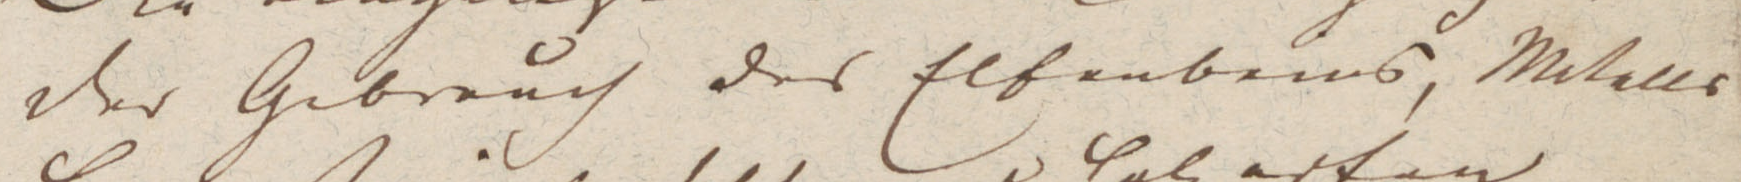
der Gebrauch des Elfenbeins, Metalls
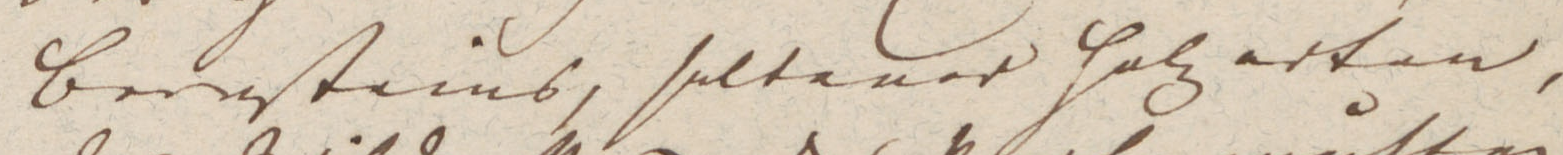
Bernsteins, seltener Holzarten,
